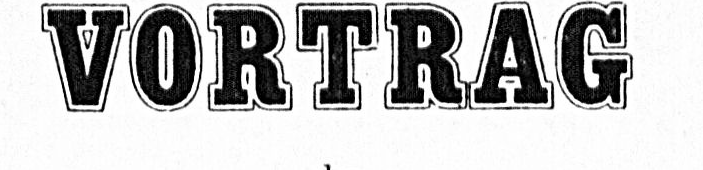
VORTRAG
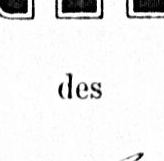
des
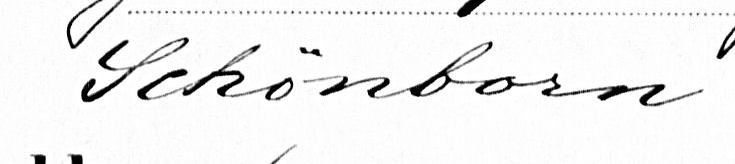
Schönborn
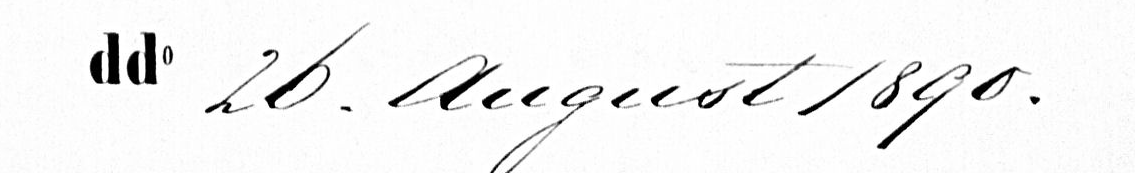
dd° 26. August 1890.
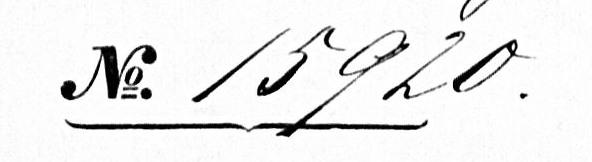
N° 15920.
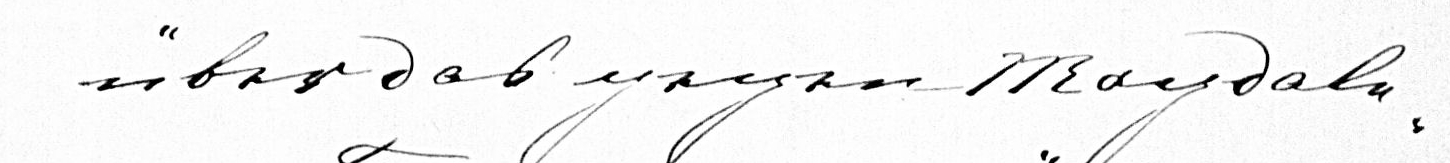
über das gegen Magdale¬
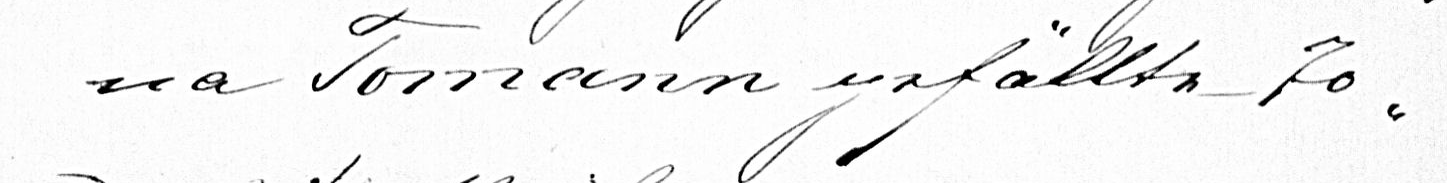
na Tomann gefällte To¬
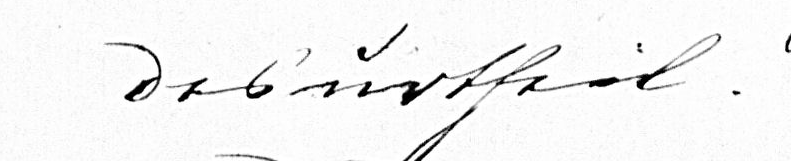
desurtheil.
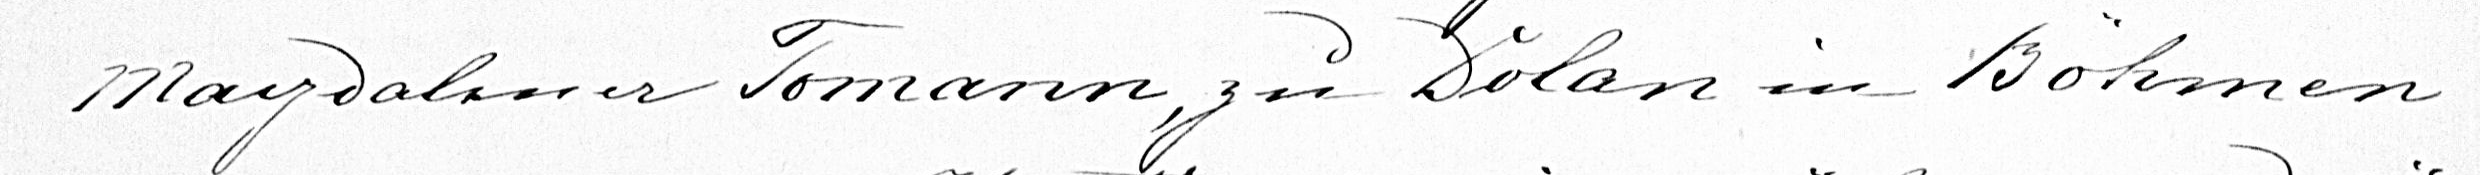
Magdalena Tomann, zu Dolan in Böhmen
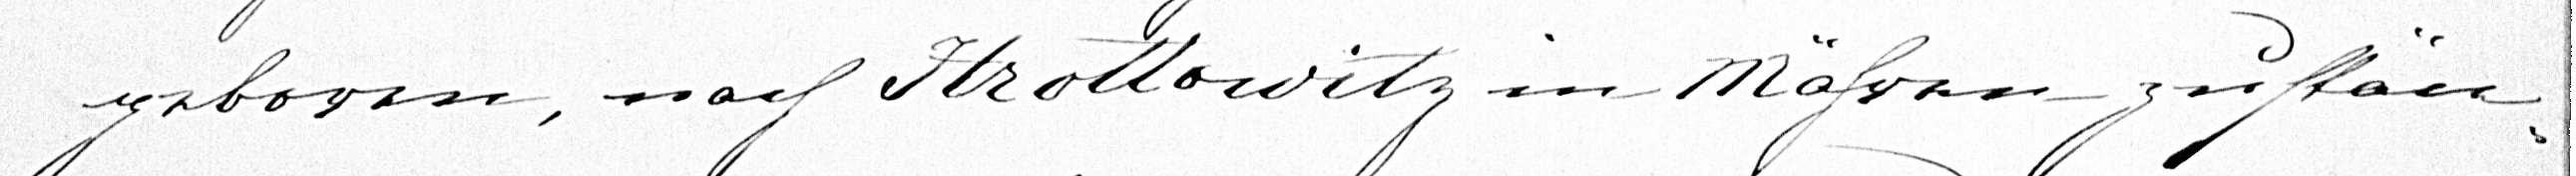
geboren, nach xxotlowitz in Mähren - zustän¬
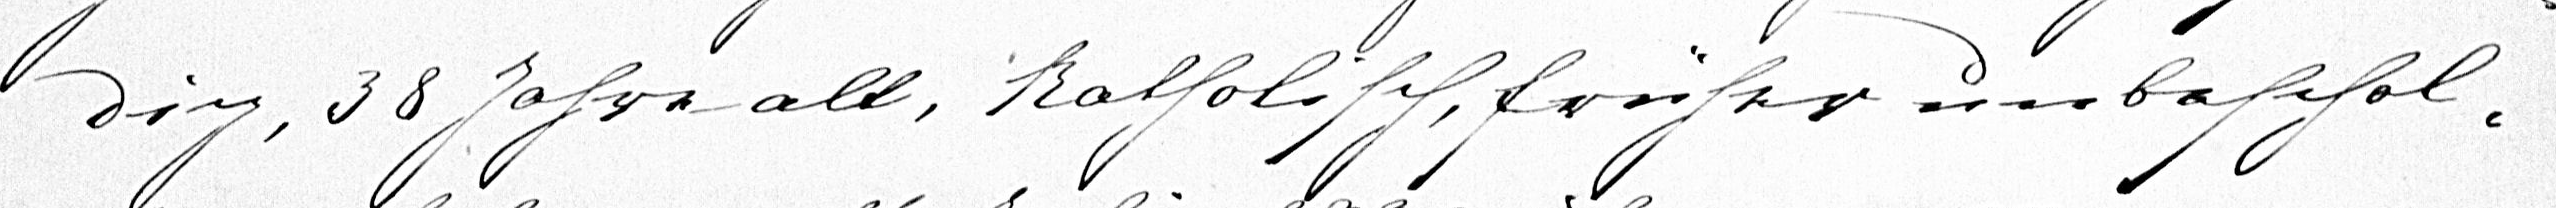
dig, 38 Jahre alt, katholisch, früher unbeschol¬
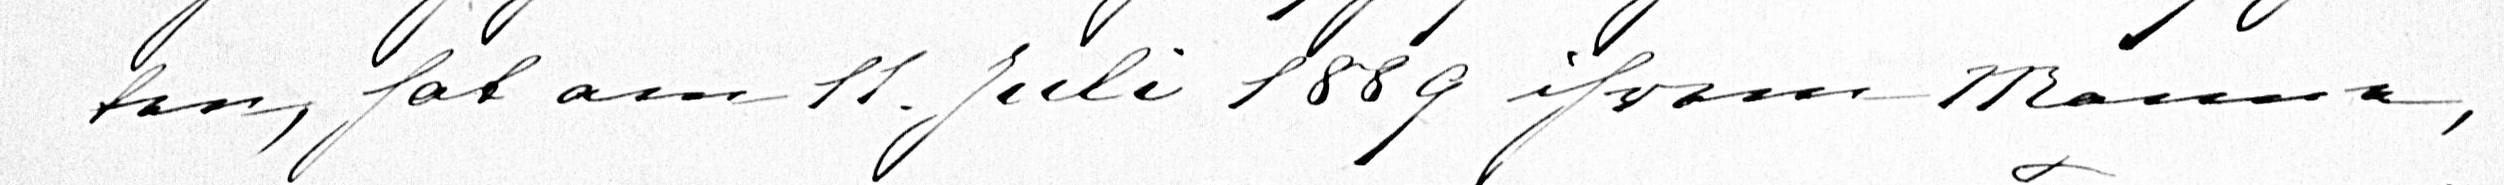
ten, hat am 11. Juli 1889 ihrem Manne,
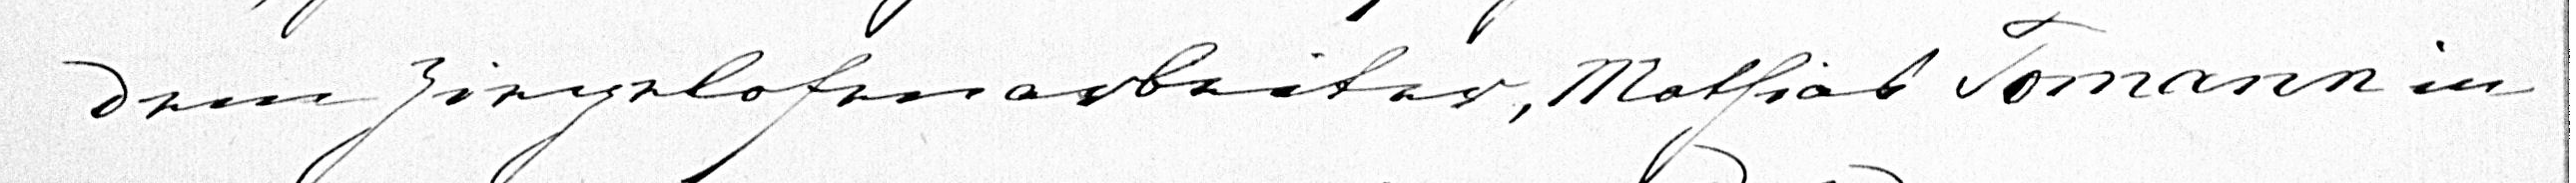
dem Ziegelofenarbeiter, Mathias Tomann in
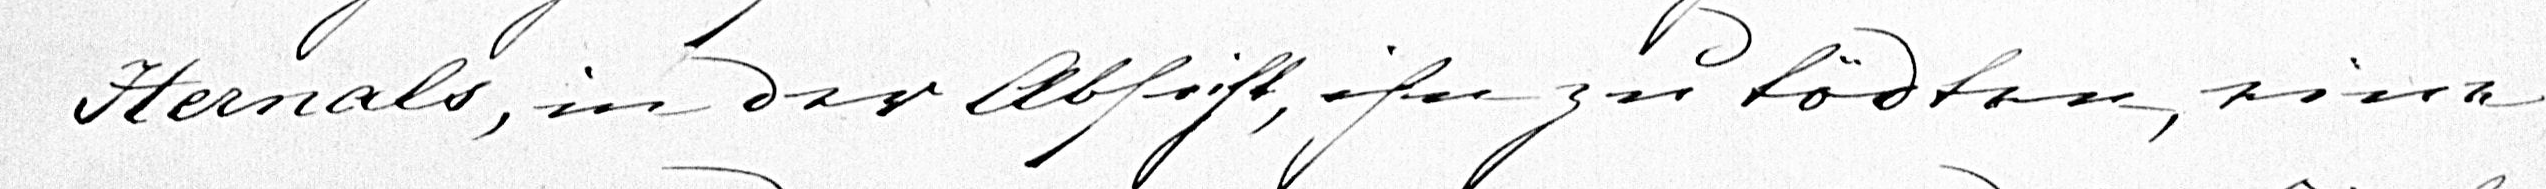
Hernals, in der Absicht, ihn zu tödten, eine
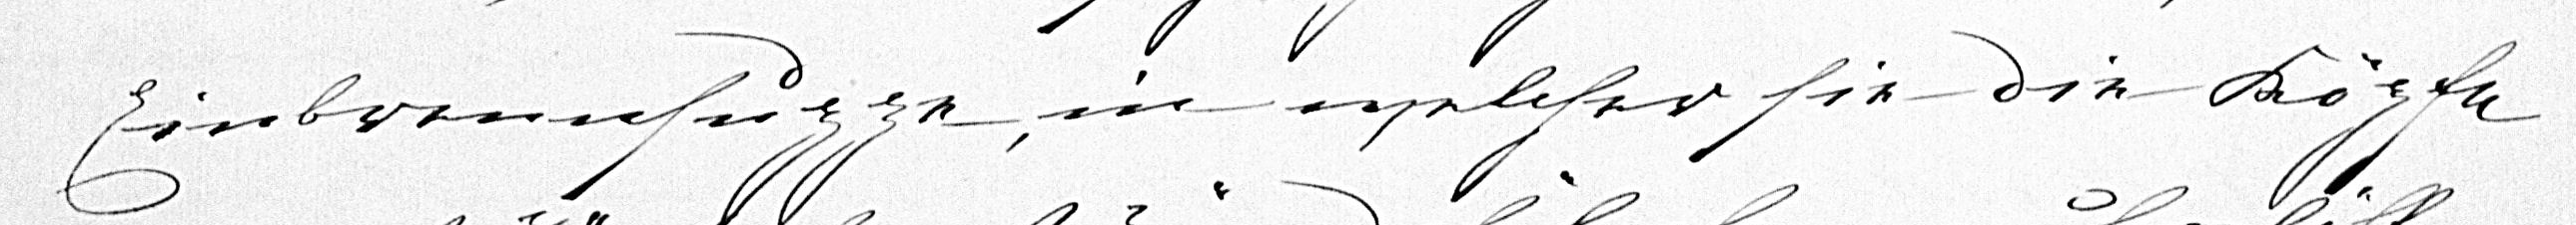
Einbrennsuppe, in welcher sie die Köpfe
